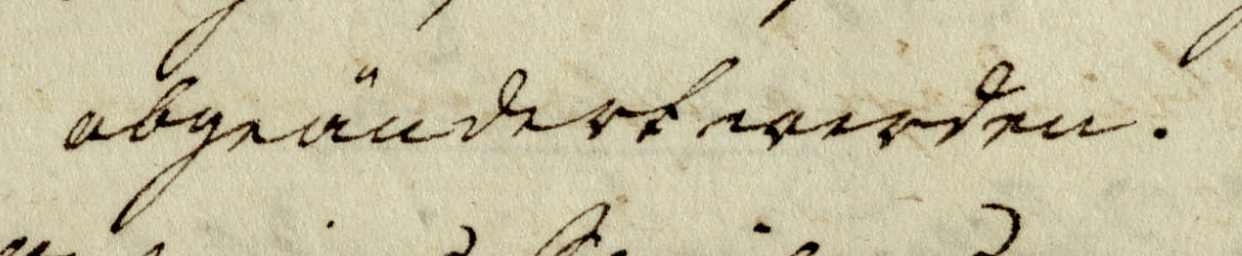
abgeändert werden.
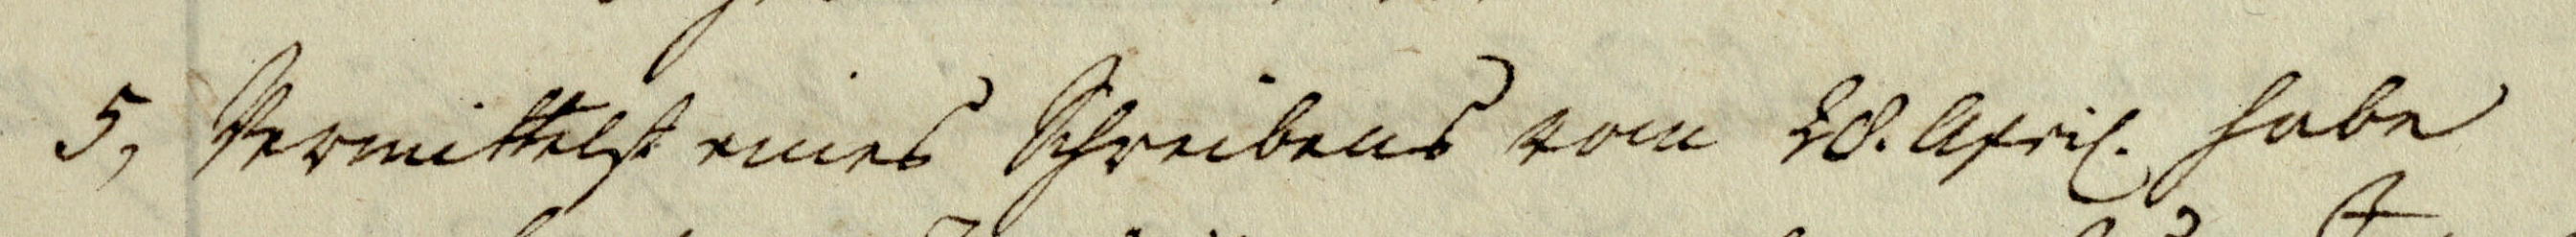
5., Vermtitelst eines Schreibens vom 28. April. habe
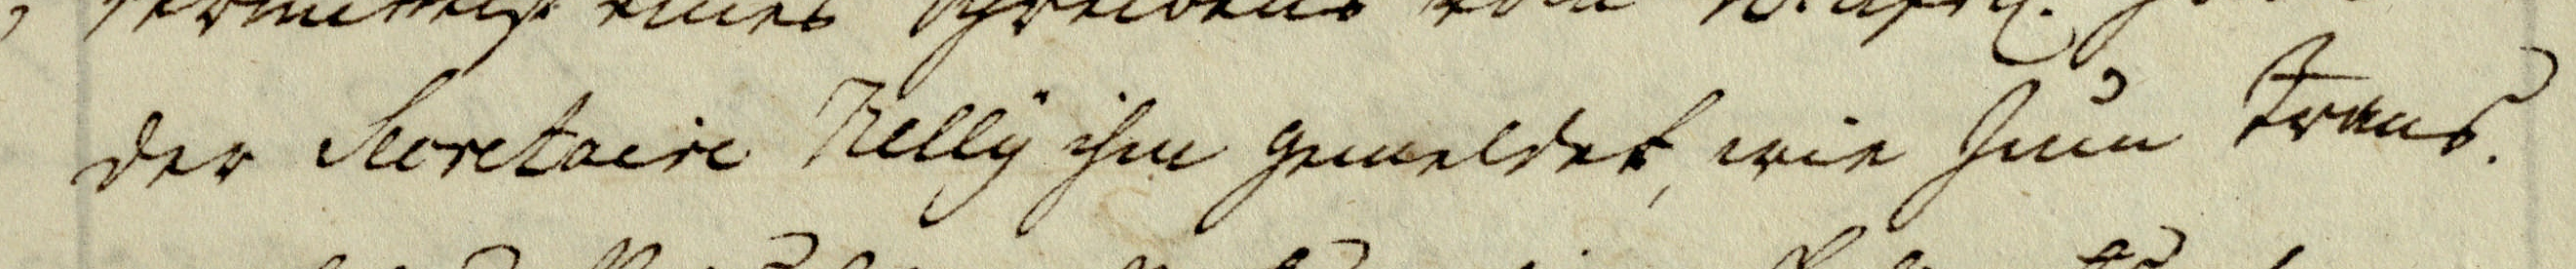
der Secretaire Nellÿ ihm gemeldet, wie zum Trans¬
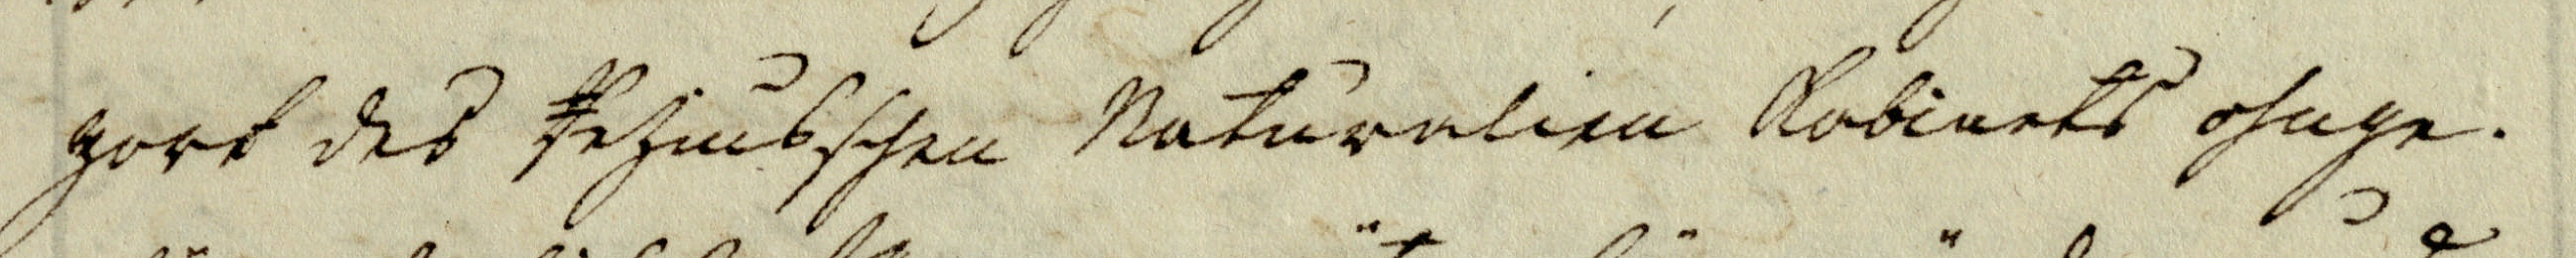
port des Reziusschen Naturalien Kabinets ohnge¬
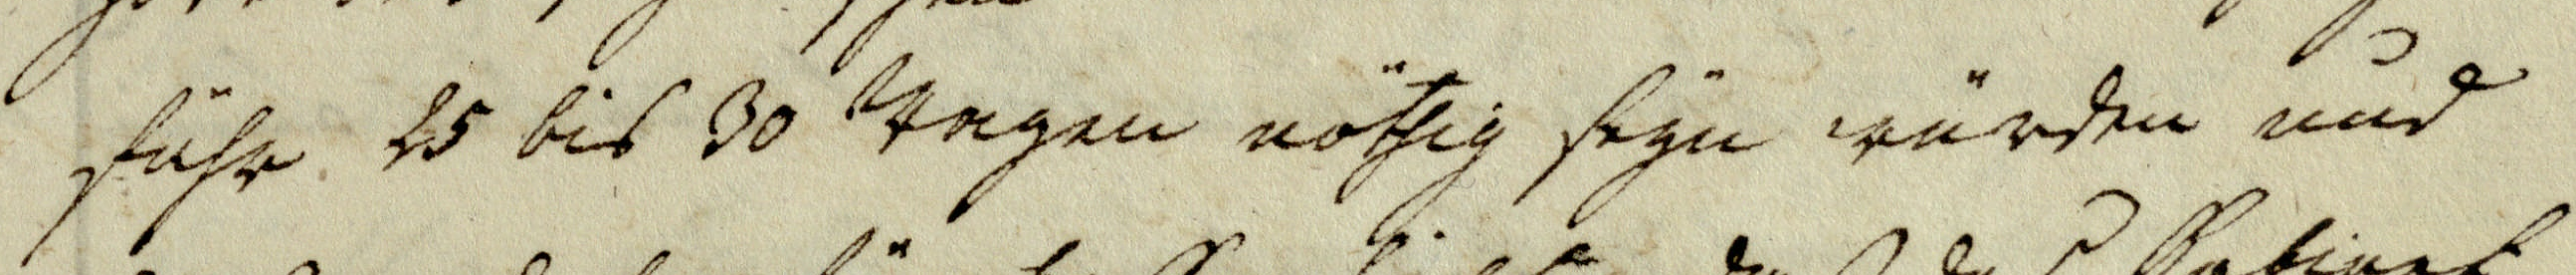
fähr 25 bis 30 Wagen nöthig seÿn würden und
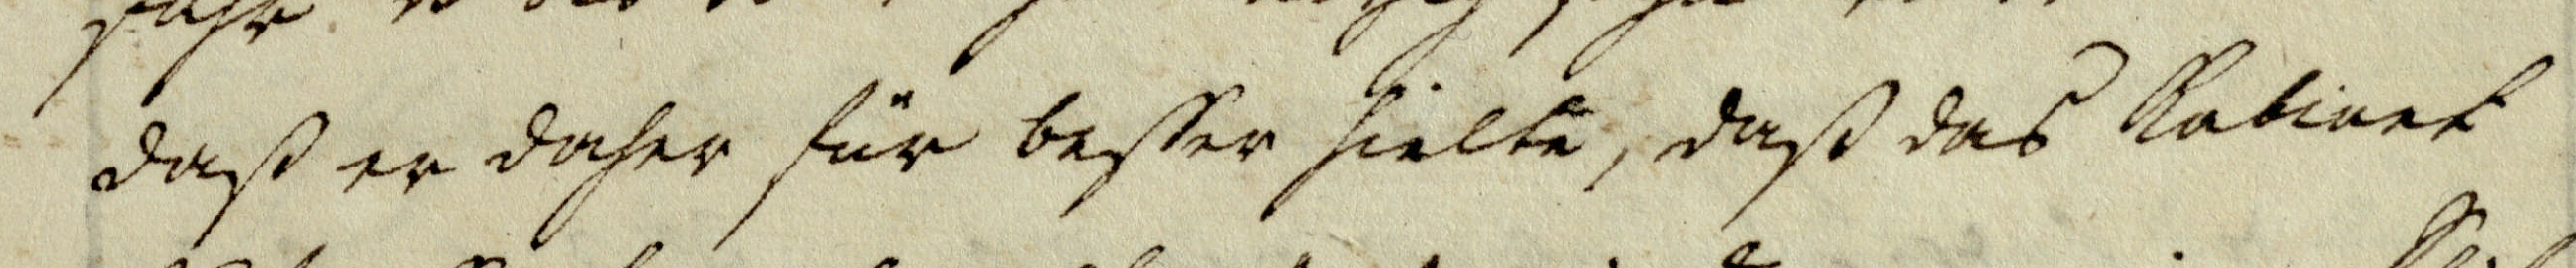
daß er daher für besser hielte, daß das Kabinet
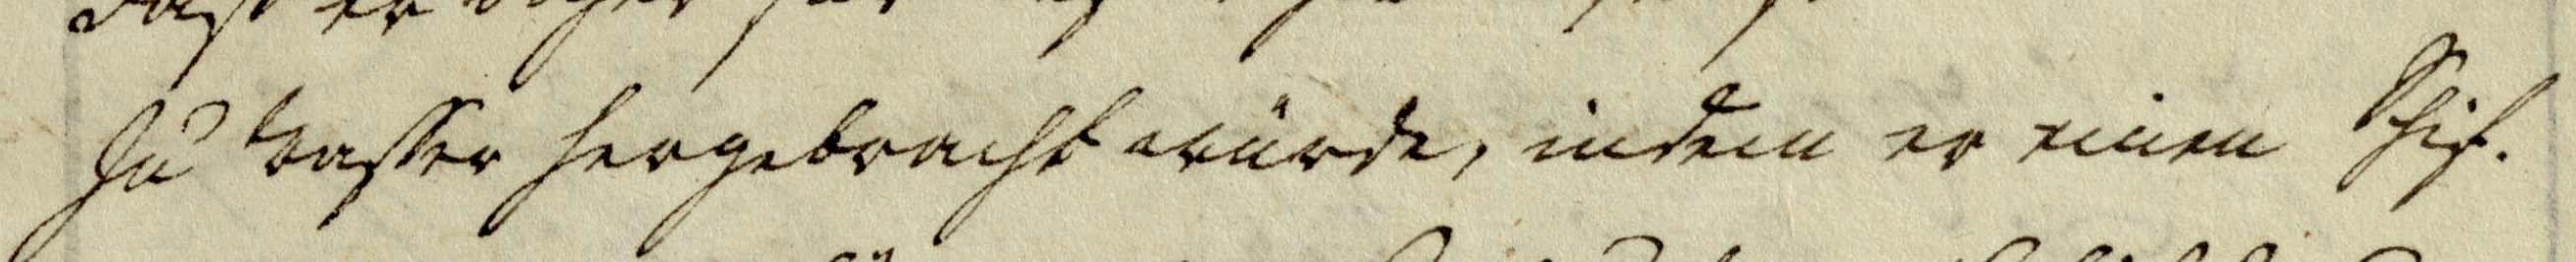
zu Wasser hergebracht würde, indem er einen Schif¬
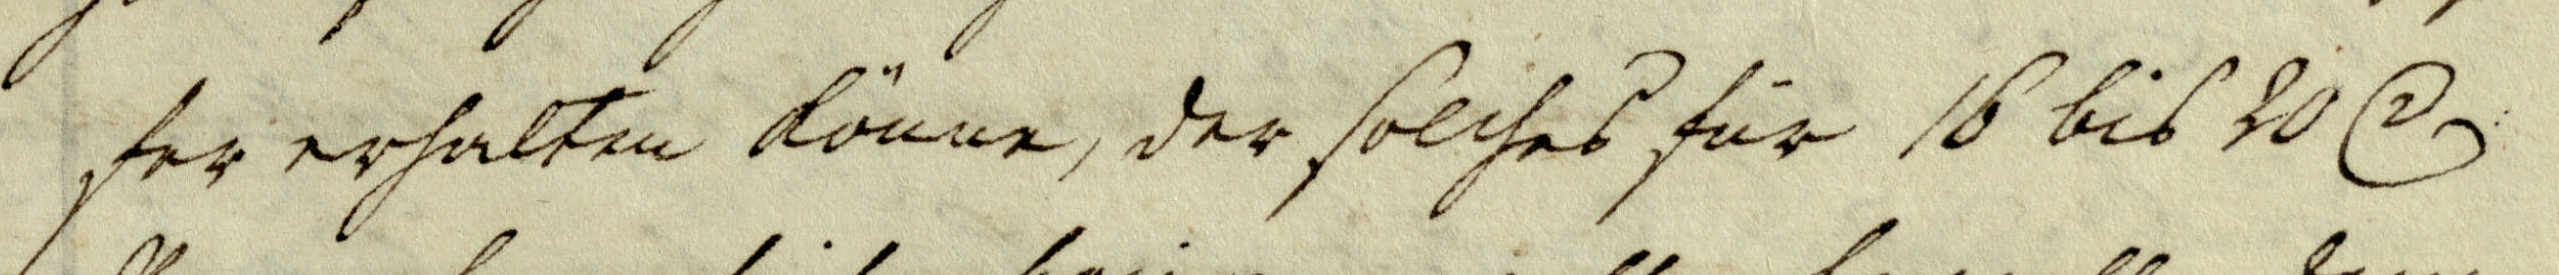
fer erhalten könne, der solches für 16 bis 20 l
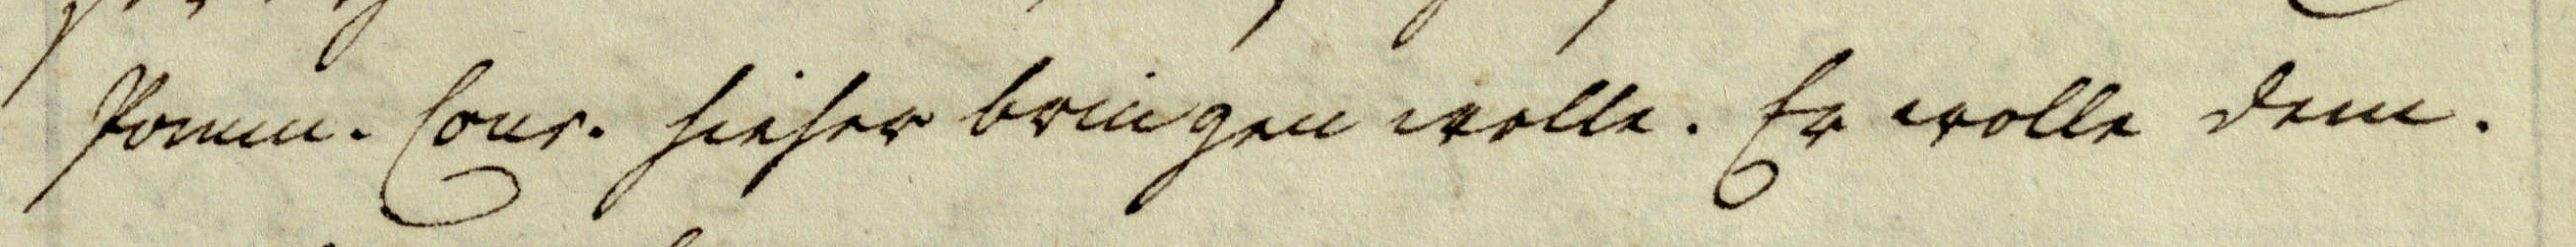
Pomm. Cour. hieher bringen wolle. Er wolle dem¬
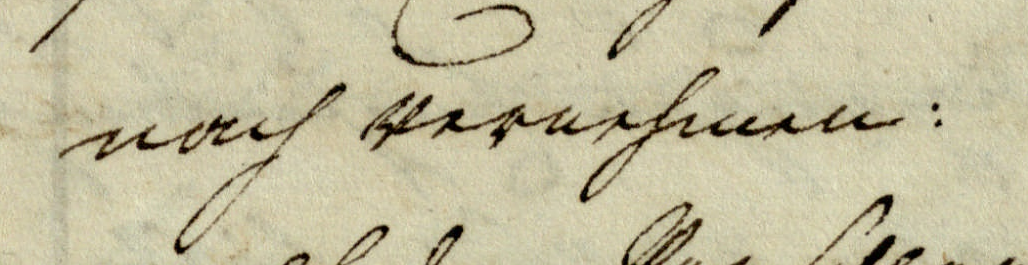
nach vernehmen:
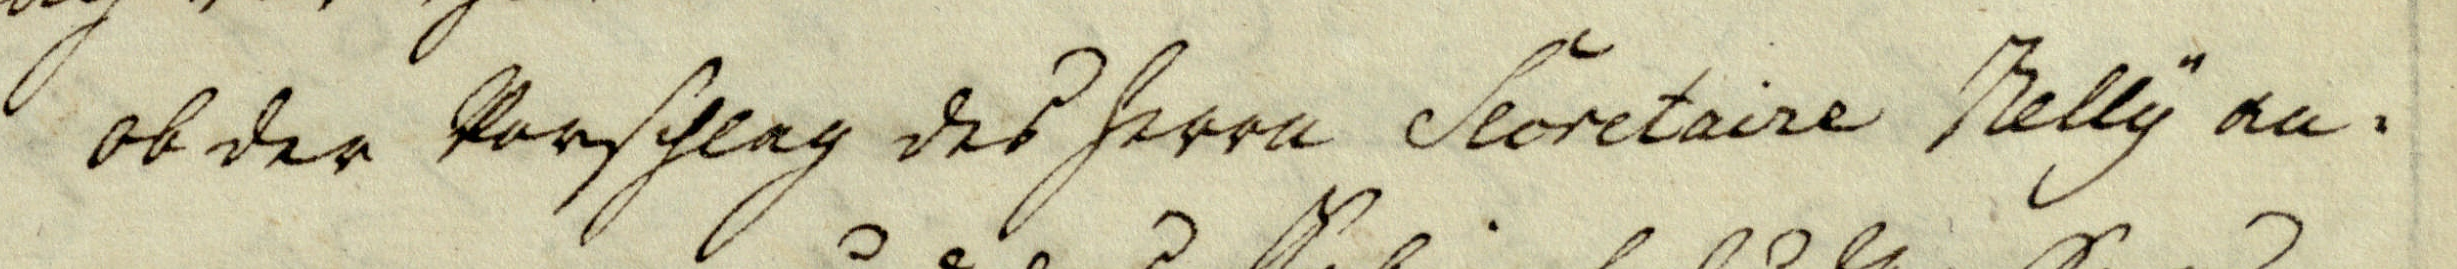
ob der Vorschlag des Herrn Secretaire Nellÿ an¬
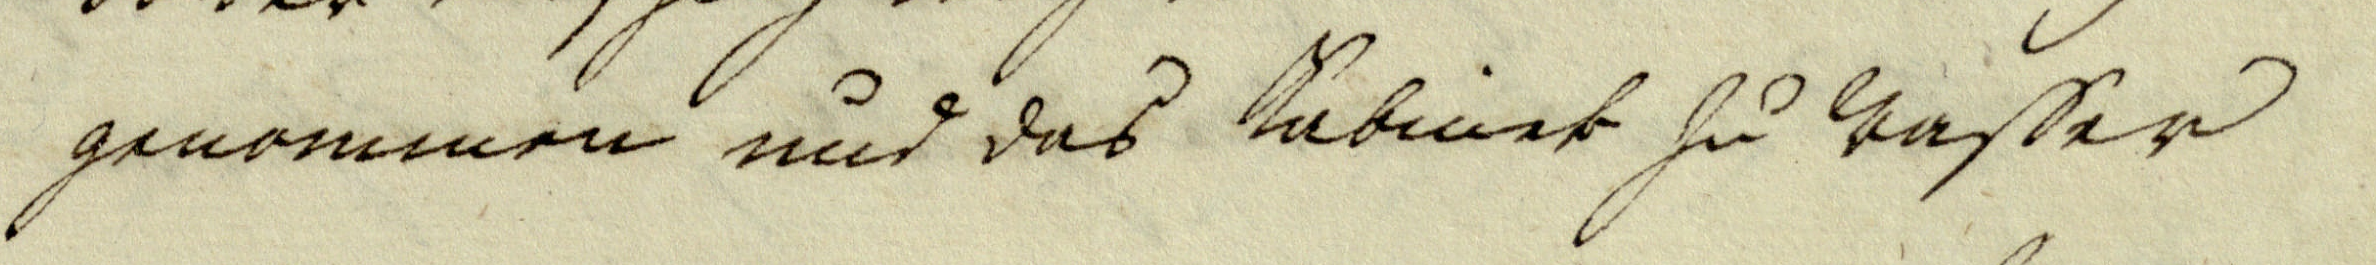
genommen und das Kabinet zu Wasser
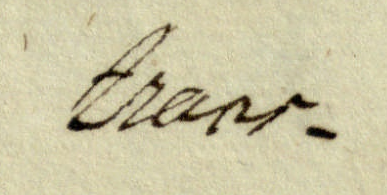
trans¬
